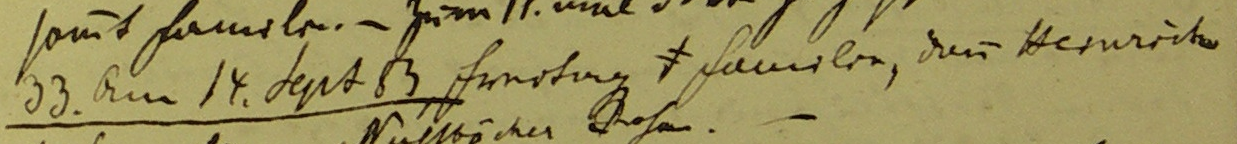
33) Am14. Sept. 83, Freitag, mit Familie, dann Heinrich
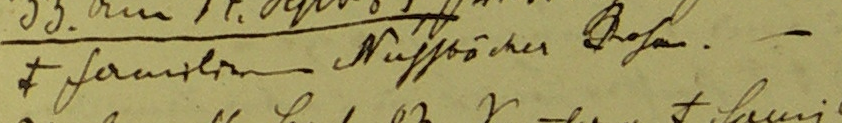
mit Familie- Nussbächer Johan.
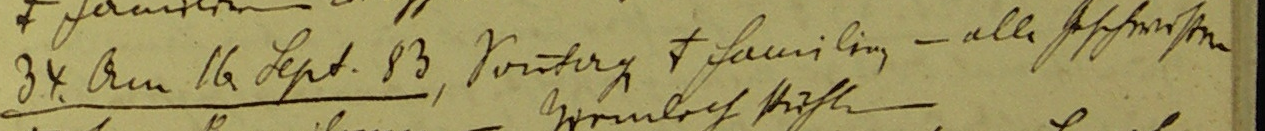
34) Am 16, Sept. 83, Sonntag, mit Familie- alle Geschwister
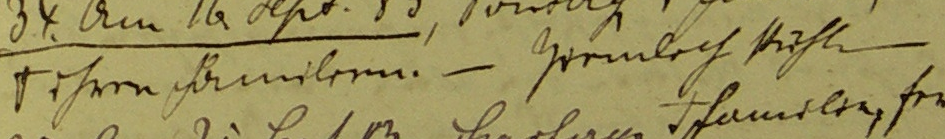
mit ihren Familien. Ziemlich kühl.
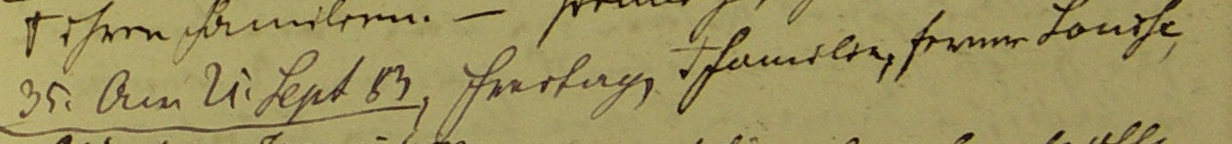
35) Am 21. Sept. 83, Freitag, Mit Familie ferner Louise,
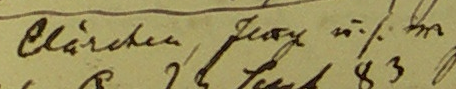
Clärchen, Jörg u.s.w.
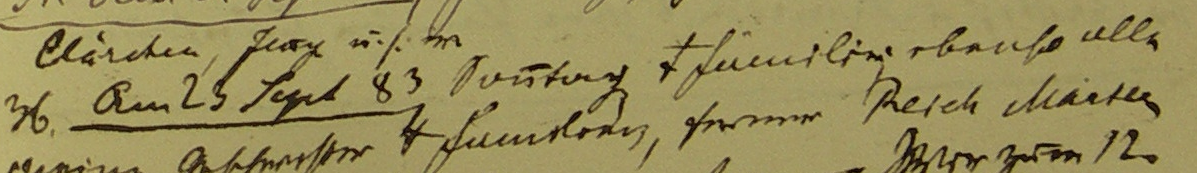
36) Am 23. Sept, 83. Sonntag, mit Familie ebenso alle
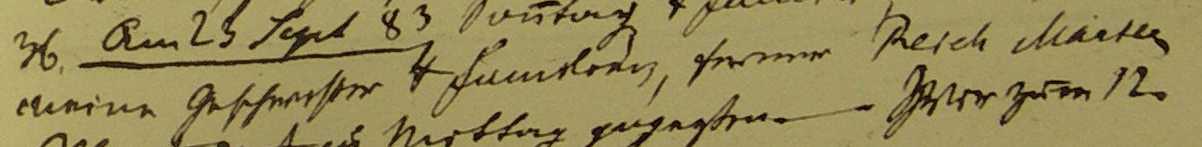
meine Geschwister mit Familie ferner Reich Martha.-
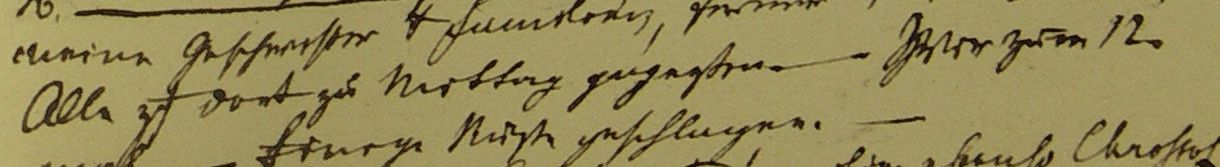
Alle zusammen dort zu Mittag gegeßen.- War zum 12.
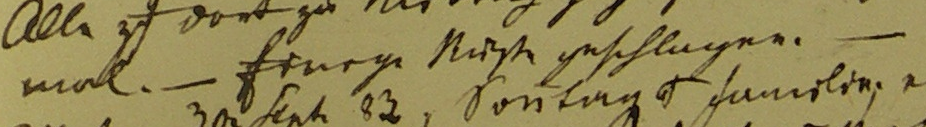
Mal.- Einige Nüße geschlagen.—
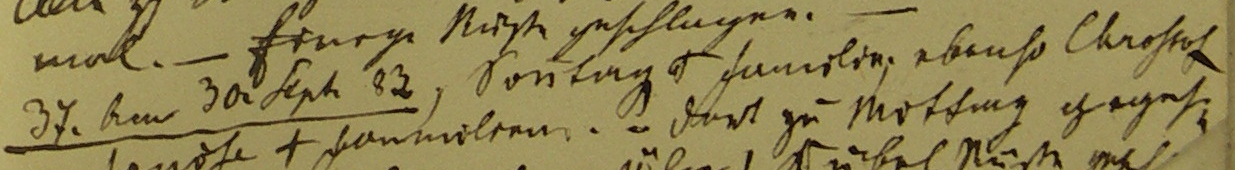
37) Am30. Sept 83, Sonntag, mit Familie; ebenso Christof
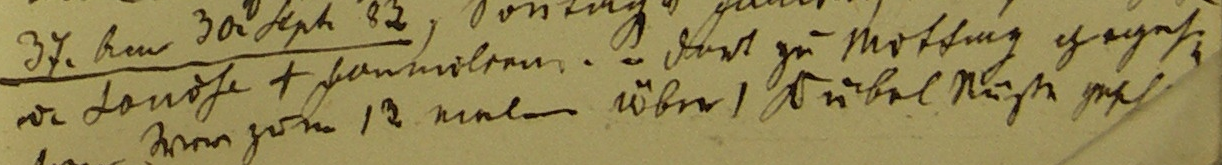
und Louise mit Familien Und dort zu Mittag gege¬
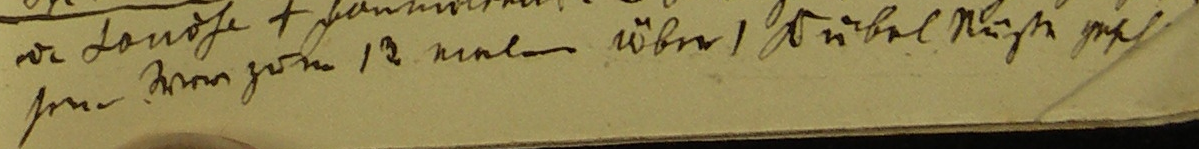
ßen. War zum 13. Mal.- über 1 Kübel Nüße geschlagen
